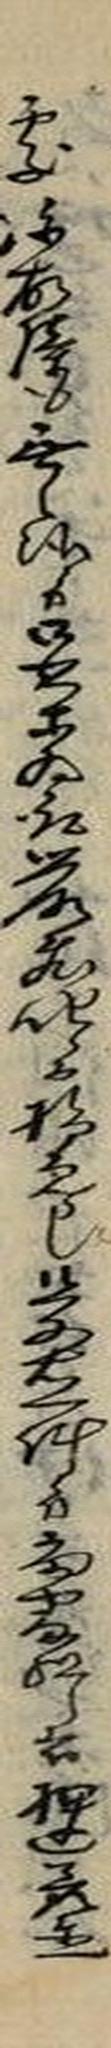処弥故障も無之趣に付口書等為取厳敷叱候而指免申候且又右一件に付当番組之者押込差置
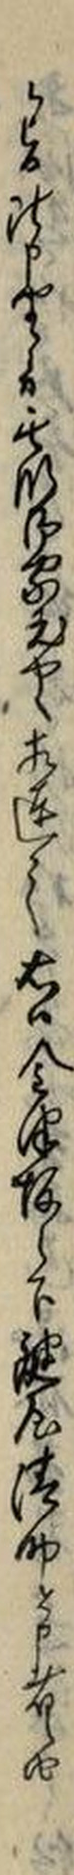候旨断申聞候に付其段御家老中へ相達之右は金津坂之下鍵屋清助と申者候由
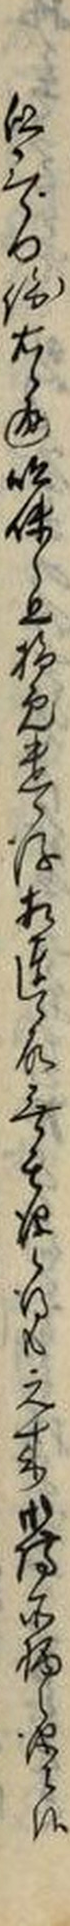但三郎右衛門儀右之通吟味之上指免遣候儀相達候故無其儀候得共元来御場所柄之儀に候
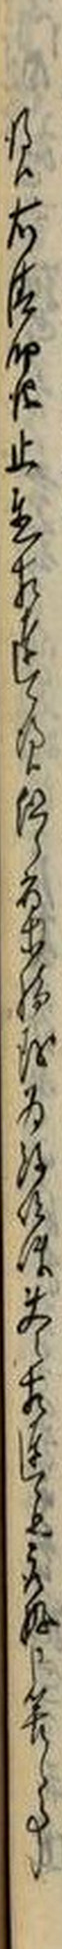得は右清助儀止置相達候得は組之者等指越為致吟味夫々相達候上取扱申筈之事
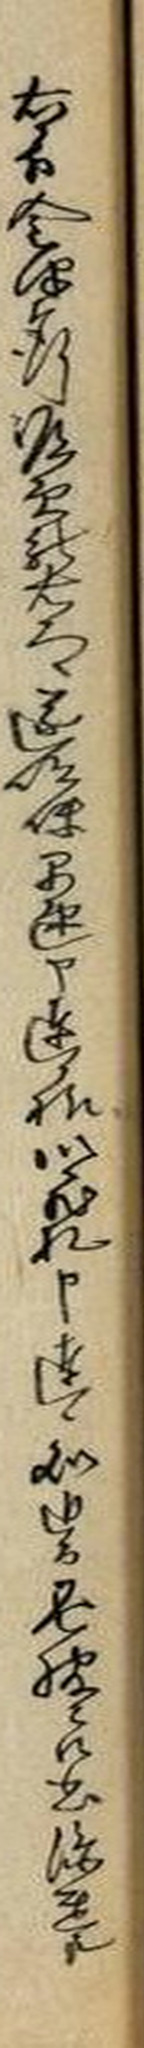右に付金津奉行渥美新右衛門へ遂吟味早速申達候様以飛札申達候処追而返報に口書添遣シ
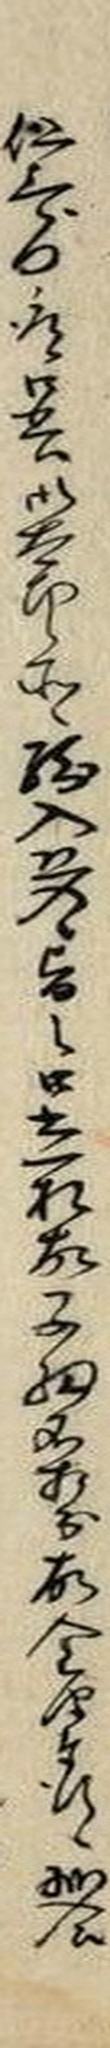但三郎右衛門取候口書は御大切之所へ紛入恐入候旨之口書一札故子細不相分故金津奉行へ掛合
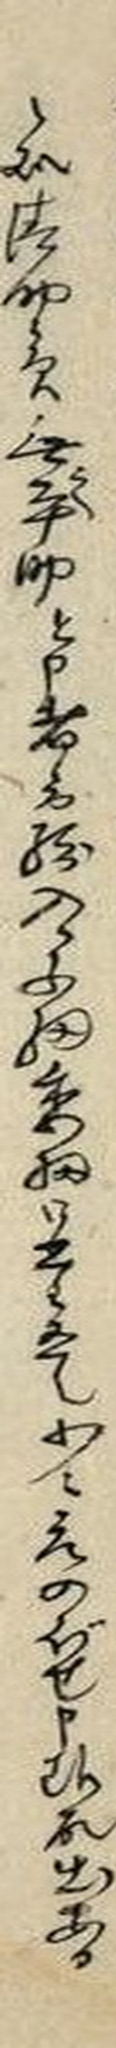候処清助に而は無之平助と申者に而紛入候子細委細口書に有之少々取のぼせ申趣故出ある
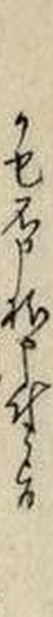かせ不申様申付候旨
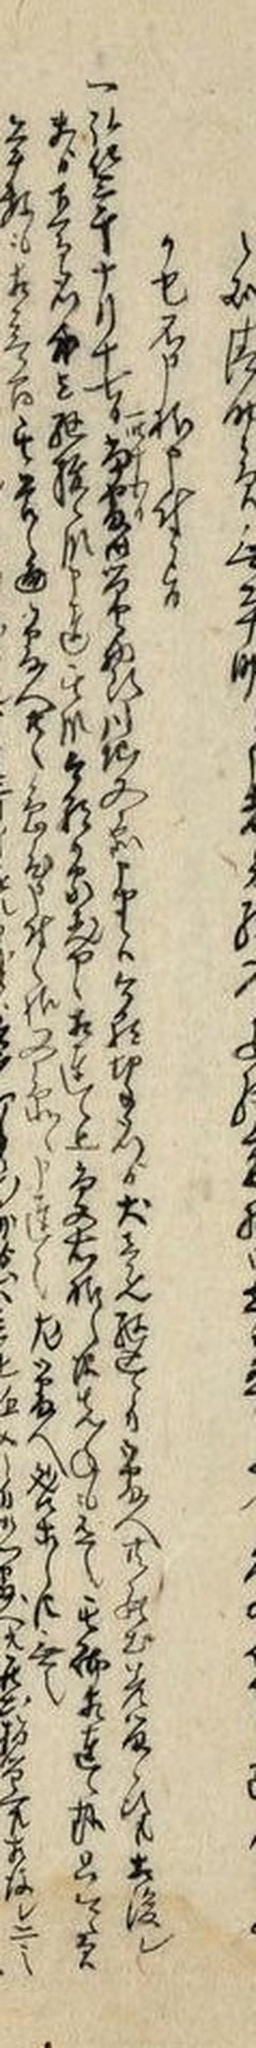一弘化三午十月十七日一昨十五日当番御留守物頭川地又兵衛申聞候は今朝切手御門ゟ犬壱疋駆込候に付御番人共罷出差留候得共相後れ
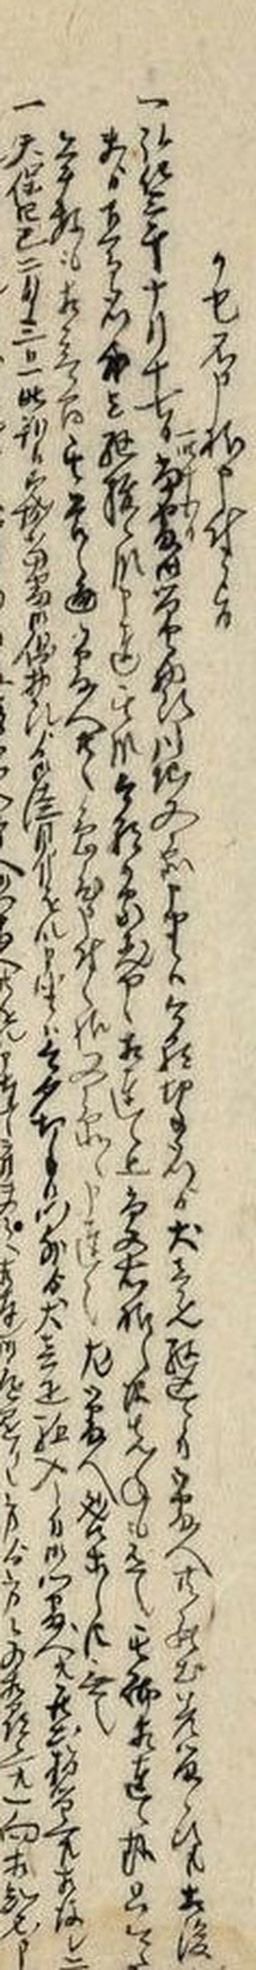夫ゟ下馬御門外迄駆抜候段申達其段今朝御家老中へ相達候上尚又右様之儀先年も有之其砌相達候趣只今に而は
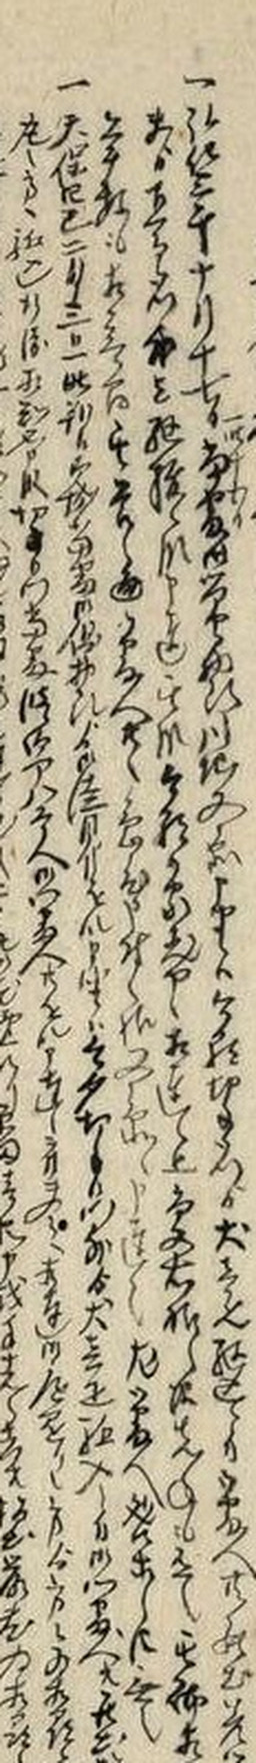年数も相立候間其節之通御番人共へ急度申付候様又兵衛へ申達之尤御番人咎等之儀無之
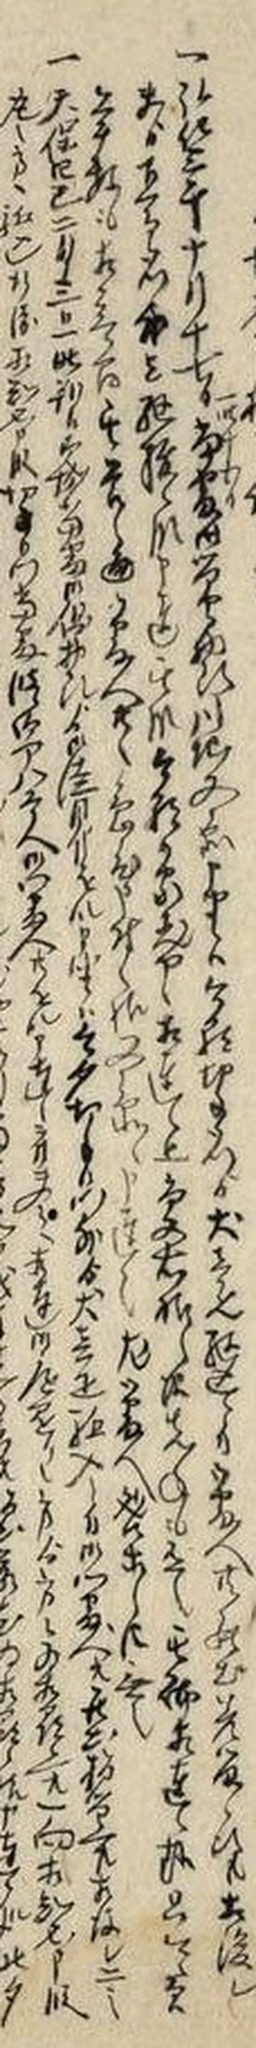年数も相立候間其節之通御番人共へ急度申付候様又兵衛へ申達之尤御番人咎等之儀無之
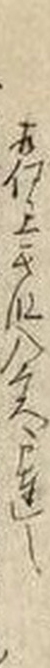相伺候上其組八太夫へ申達之
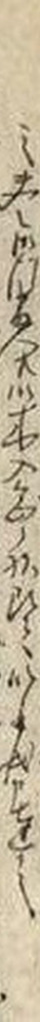之夫々御門番人共以来入念候様頭々へ以手紙申達之
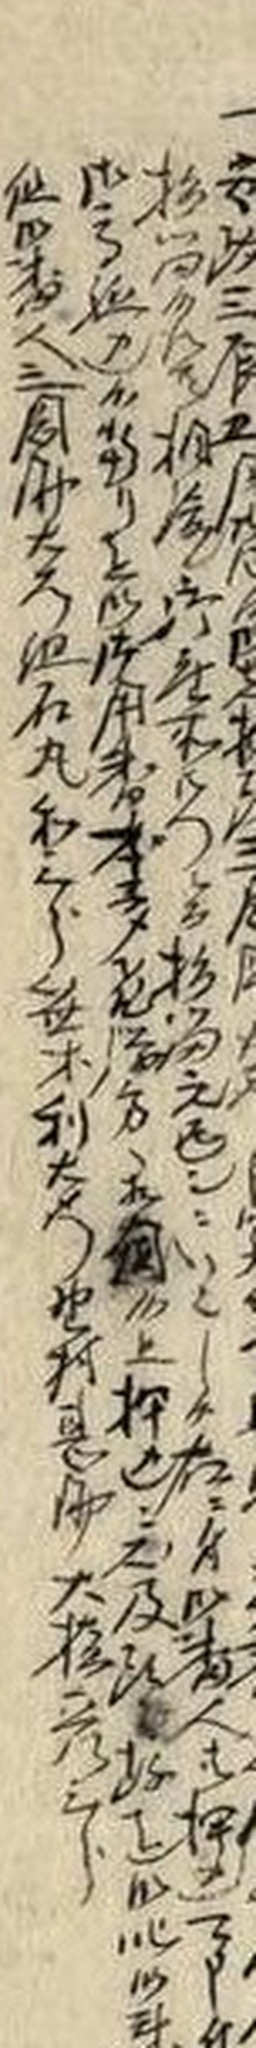但御番人三岡助右衛門組石丸和三郎笹木利右衛門野村甚助大橋彦三郎

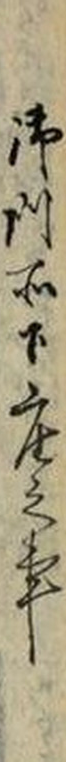御門所下座之事
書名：御門御櫓之部
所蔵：福井県文書館 Fukui Prefectural Archives
